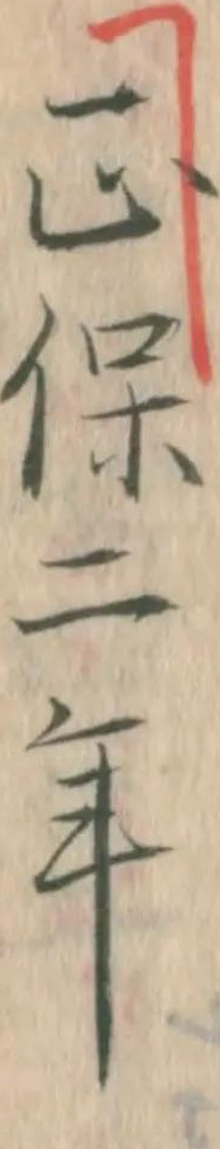正保二年
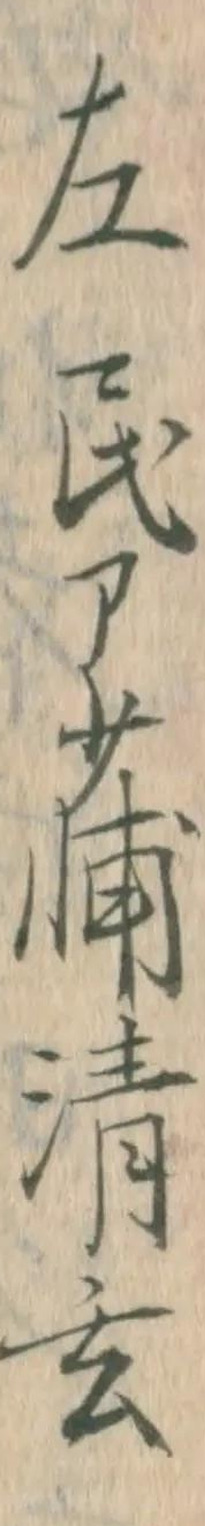左民部少輔清玄
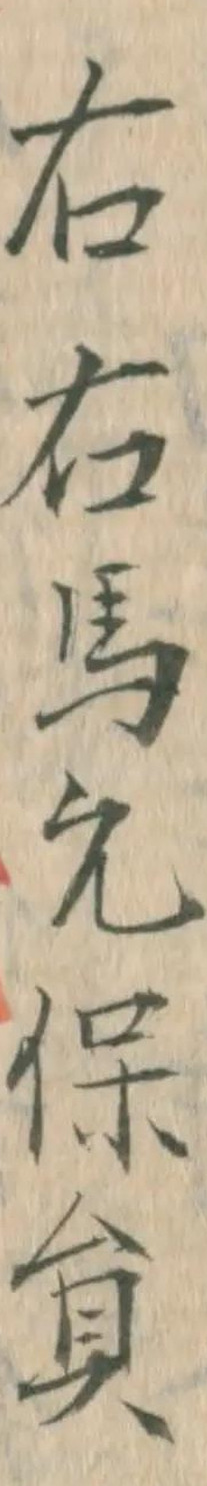右右馬允保員
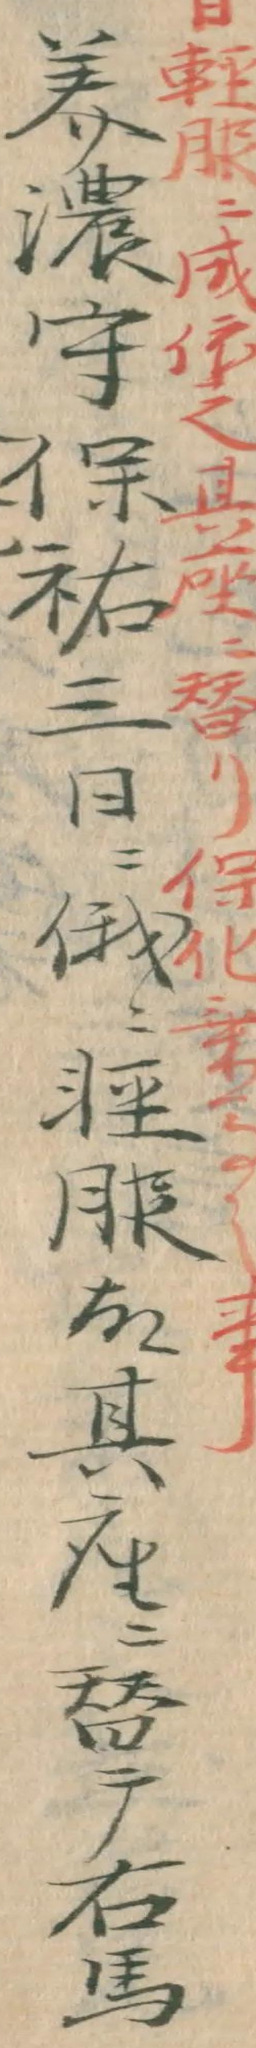美濃守保祐三日ニ俄ニ軽服故其座ニ替テ右馬
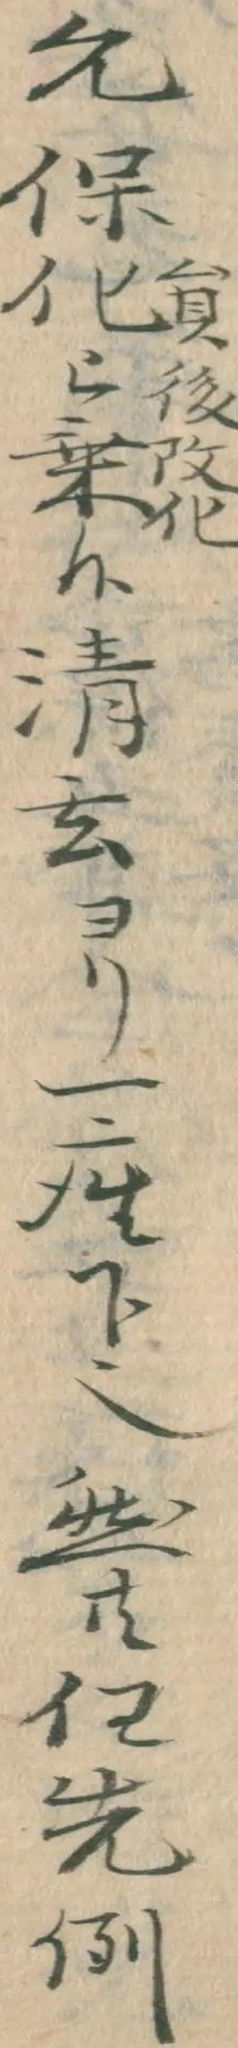允保化被乗候清玄ヨリ一座下也然共任先例
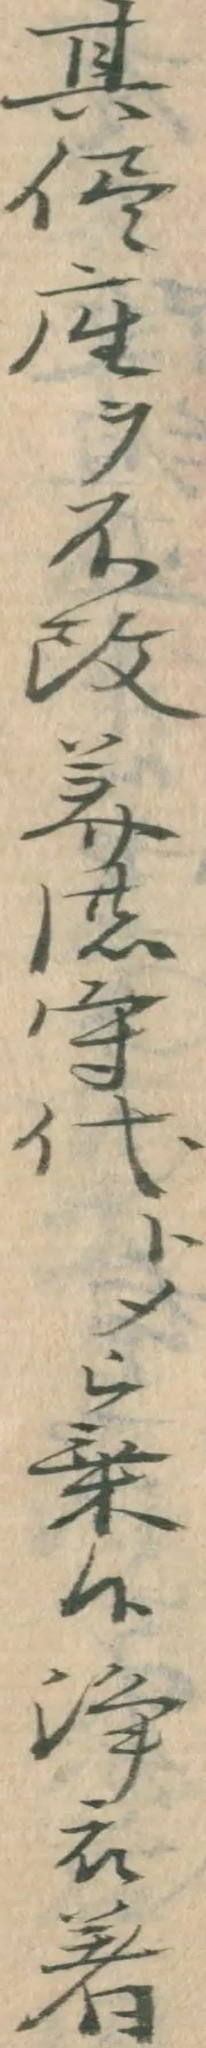其儘座ヲ不改美濃守代トシテ被乗候浄衣着
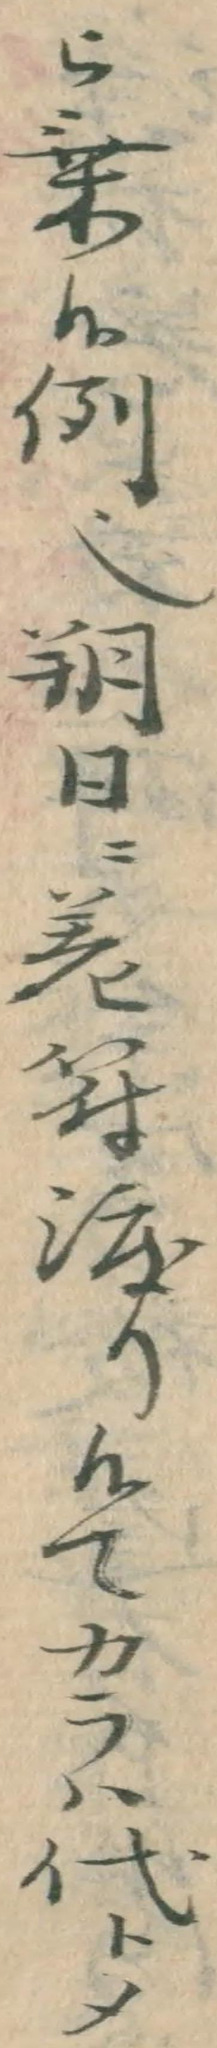被乗候例也朔日ニ差符渡リ候てカラハ代トシテ

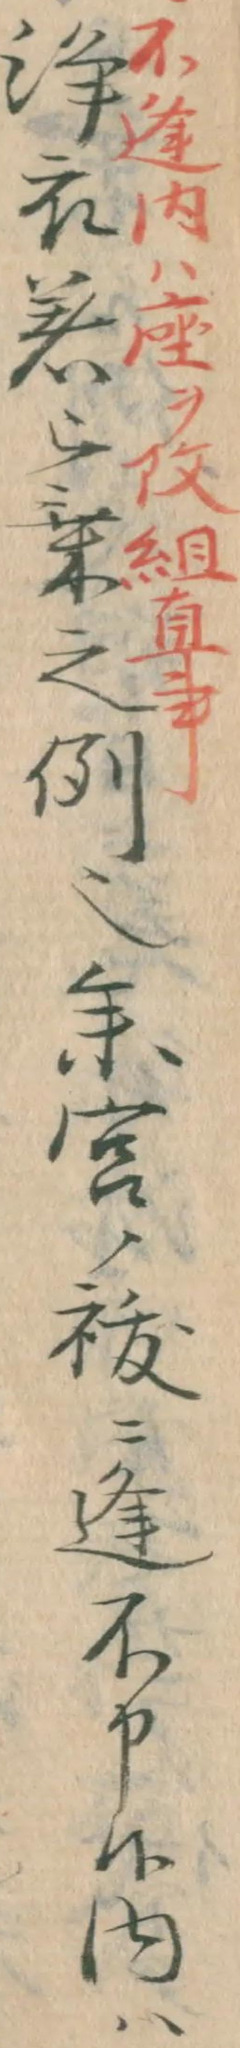浄衣着被乗之例也参宮ノ祓ニ逢不申候内ハ
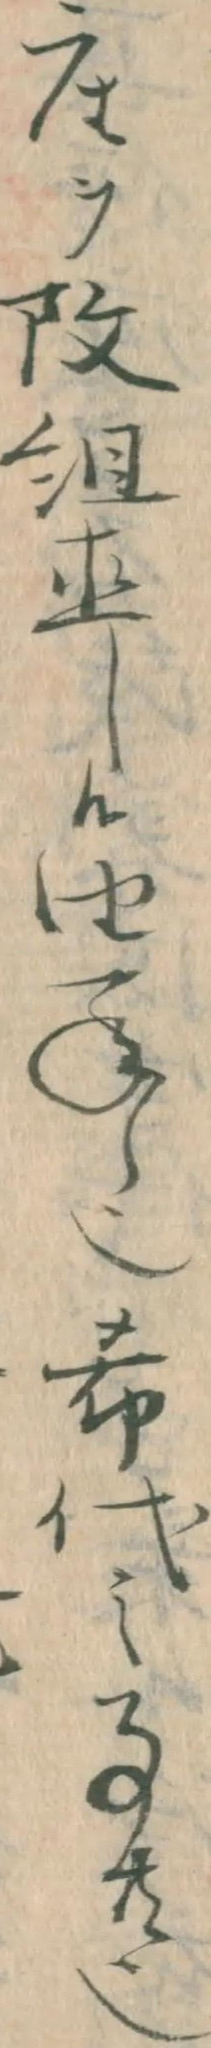座ヲ改組直し候由承候也希代之事共也
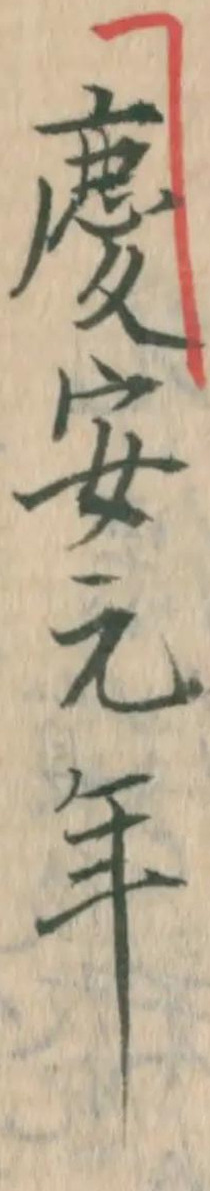慶安四年
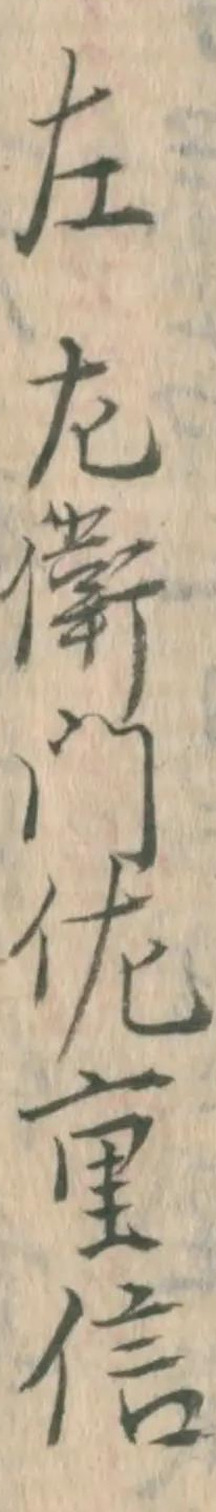左左衛門佐重信
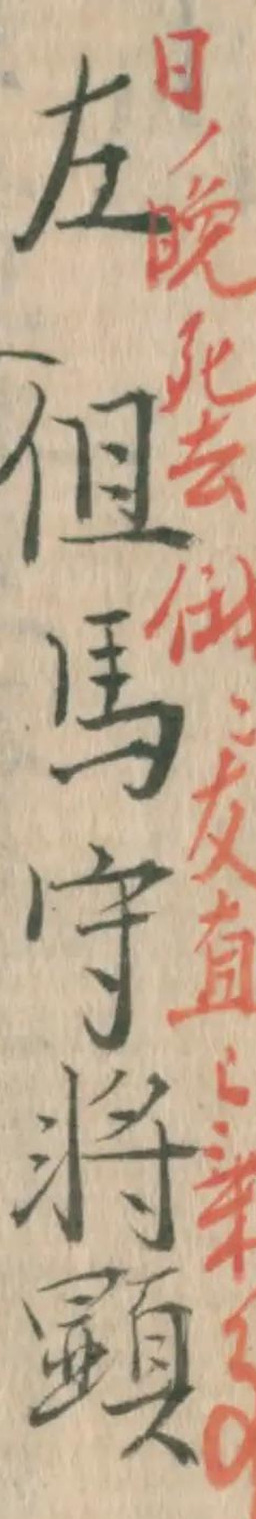左但馬守将頭
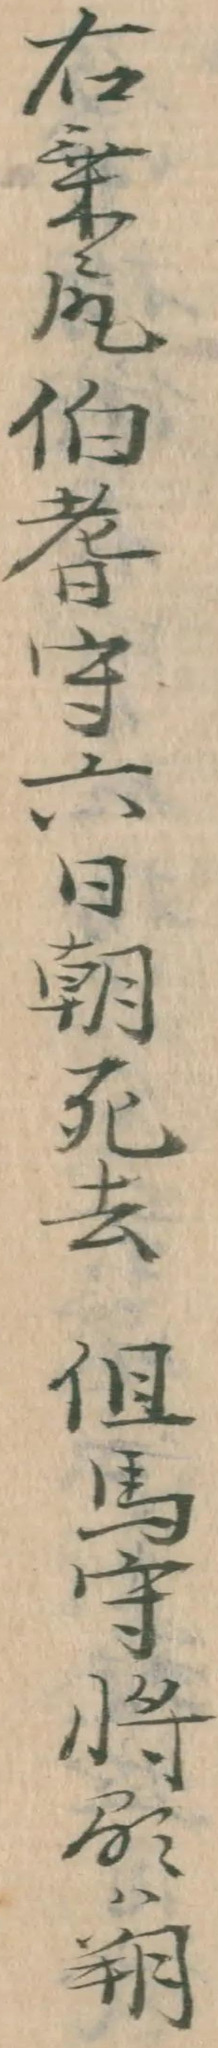右乗尻伯耆守六日朝死去但馬守将顕ハ朔
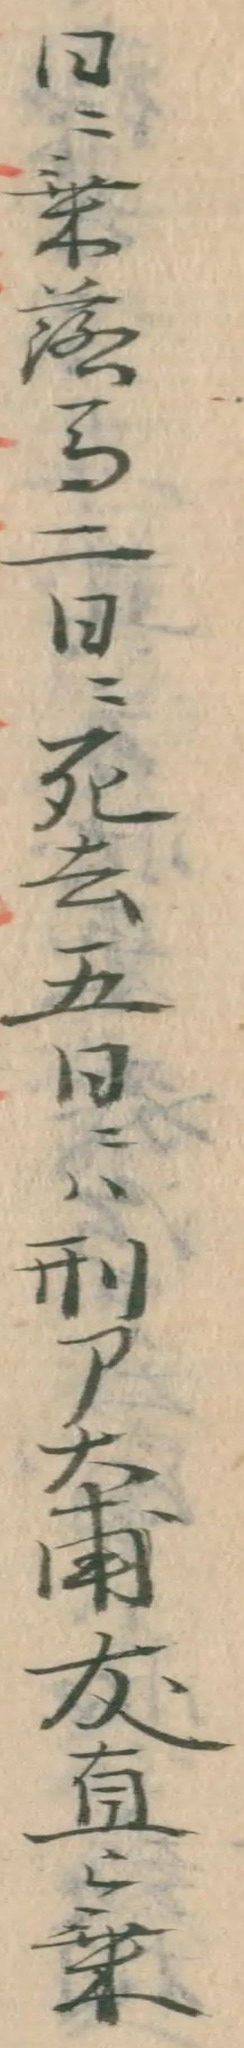日ニ乗落馬二日ニ死去五日ニハ刑部大輔友直被乗
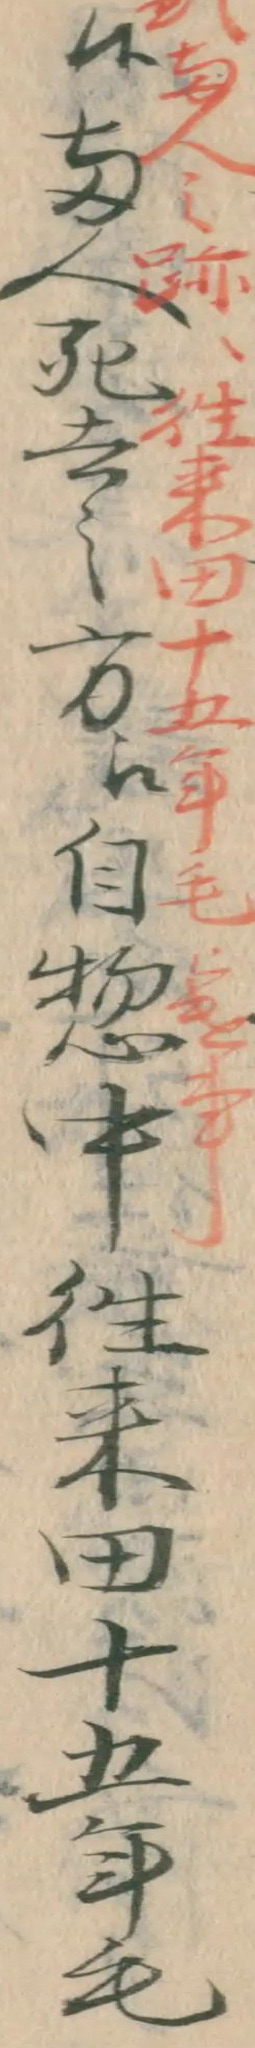候両人死去之方江自惣中往来田十五年毛
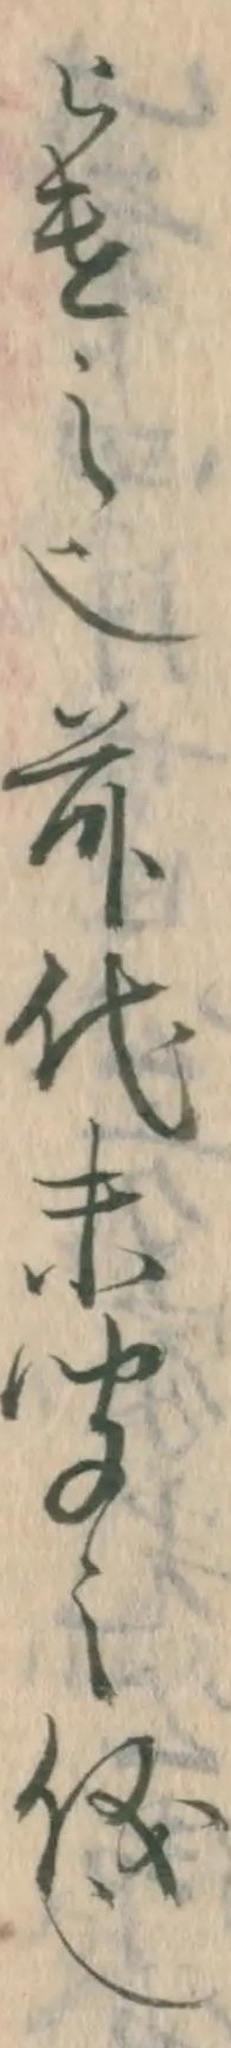被遣之也前代未聞之儀也
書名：賀茂社記録. 第10冊
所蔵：国立国会図書館 National Diet Library, JAPAN
